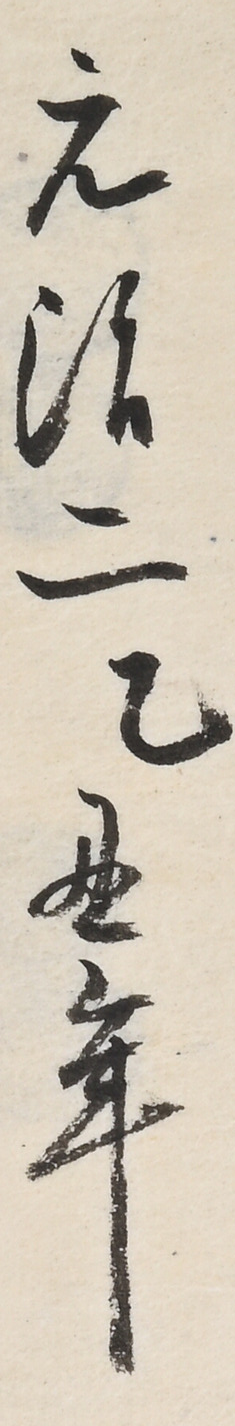㊞元治二乙丑年
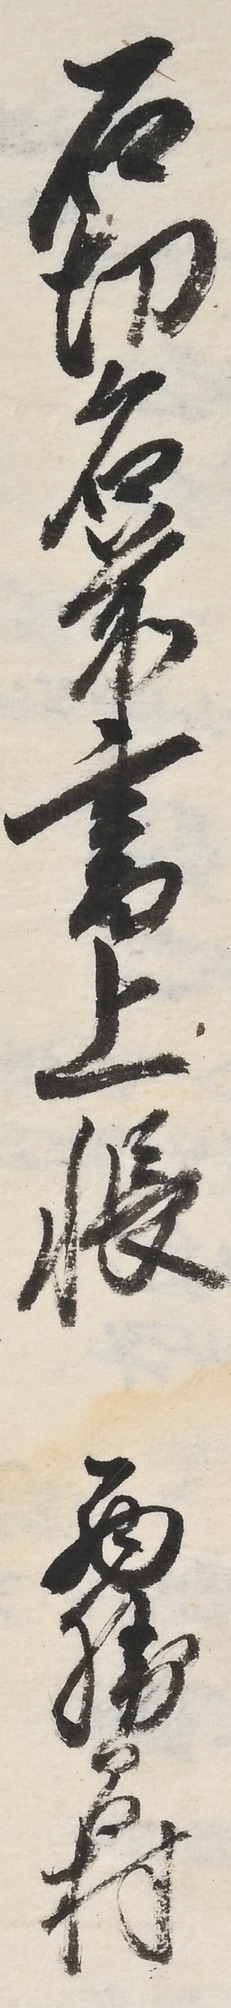石切名前書上帳西勝間村

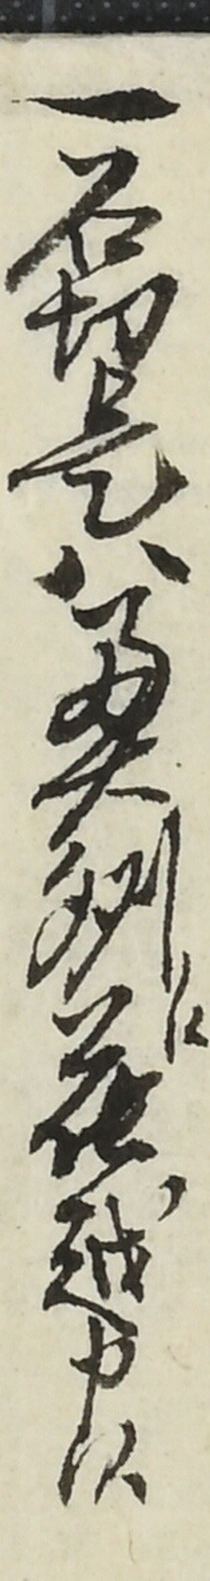一石切是ハ奥州江罷越申候
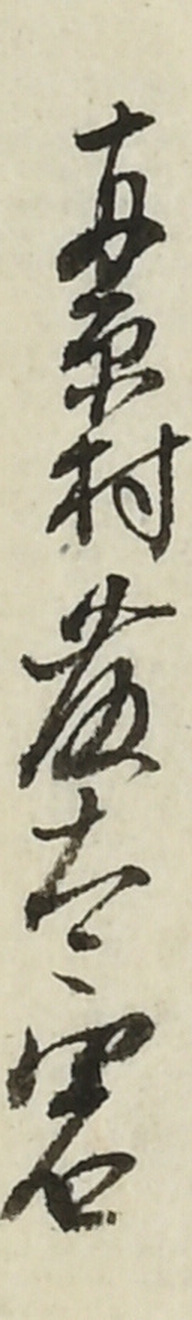両原村藤太宿

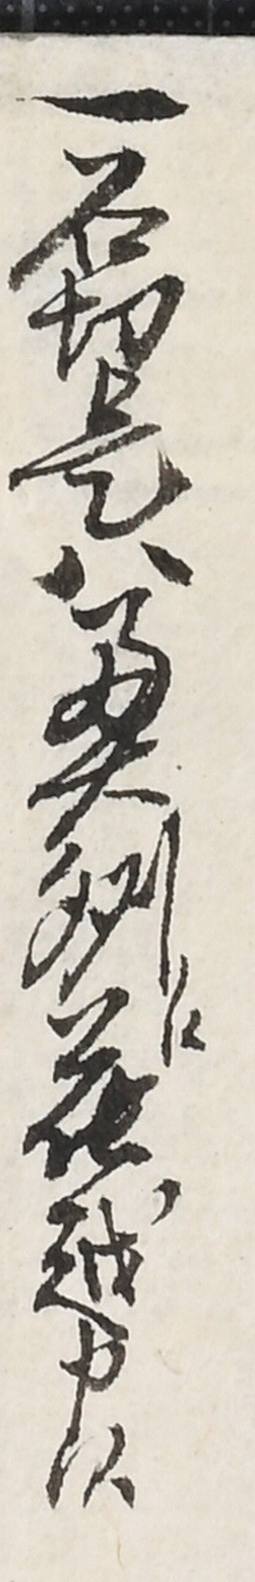一石切是ハ奥州江罷越申候
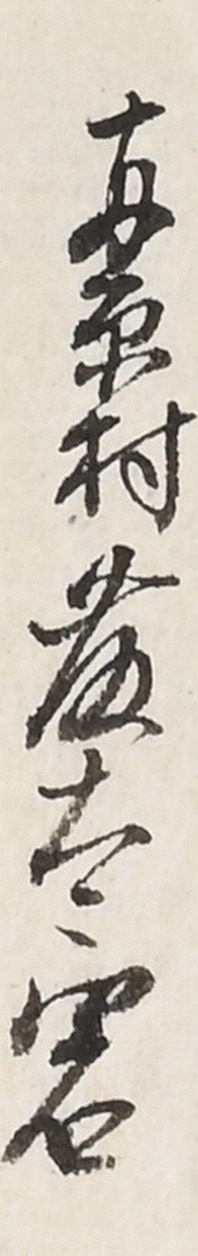両原村藤太宿
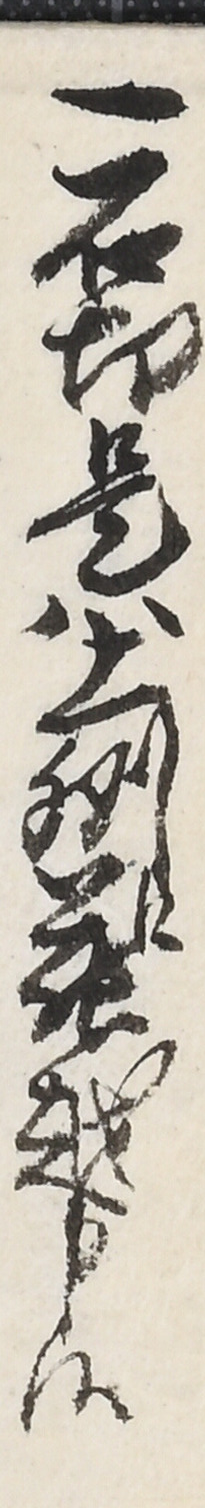一石切是ハ上州江罷越申候
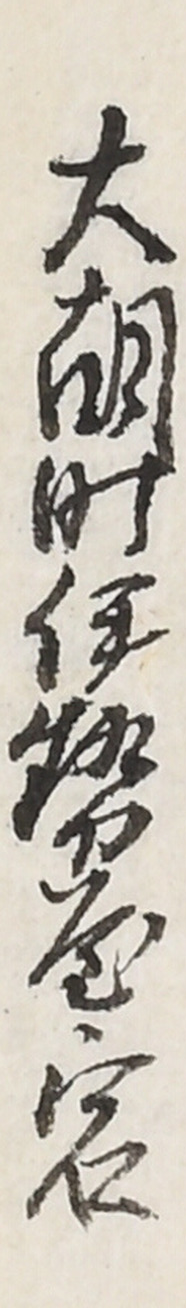大胡町伊勢屋宿
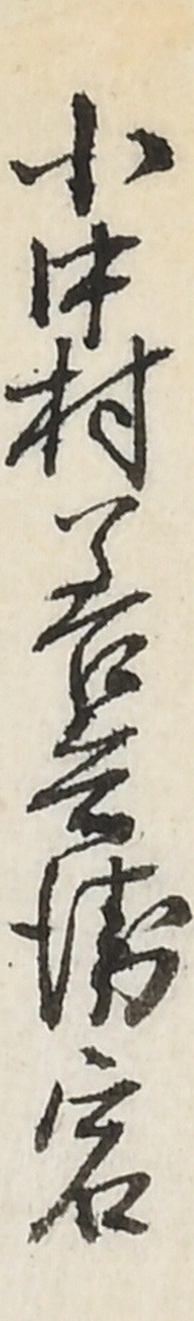小中村善兵衛宿
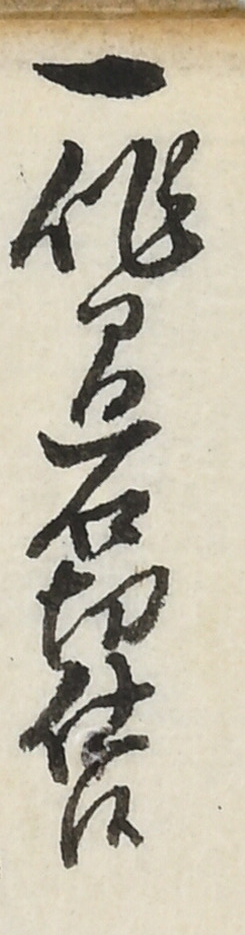一作間石切仕候

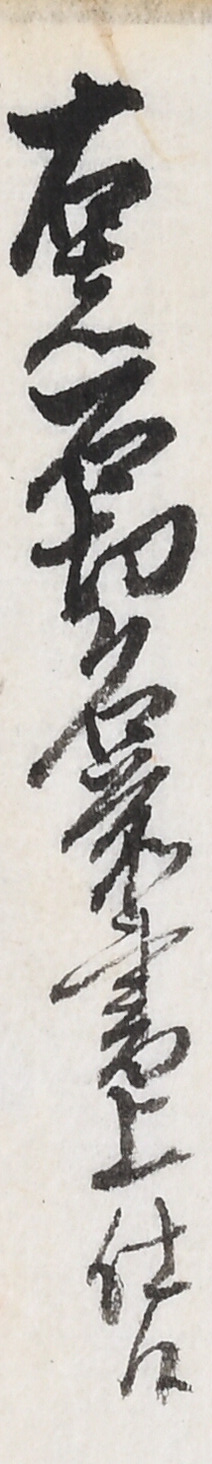右者石切名前書上仕候
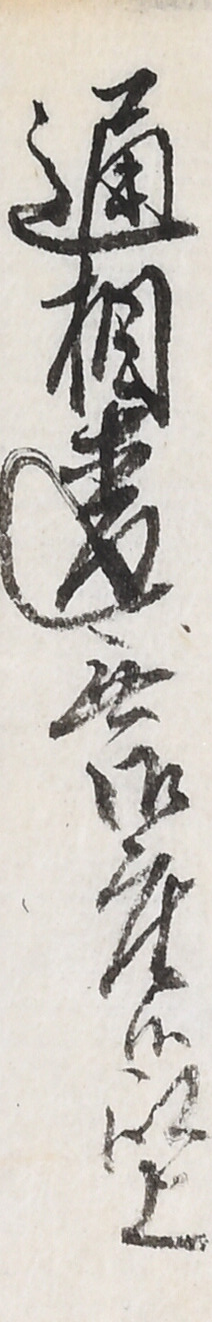通相違無御座候以上
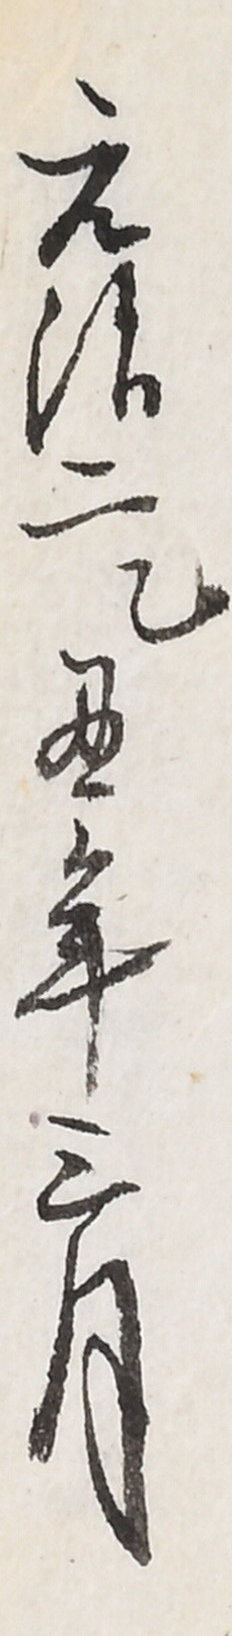元治二乙丑年三月
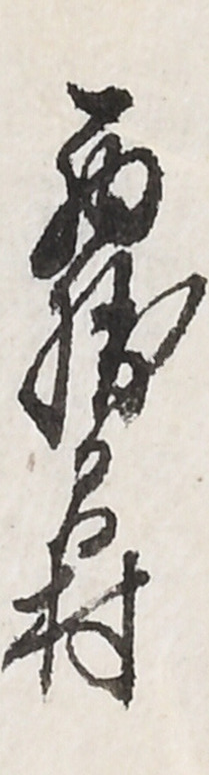西勝間村
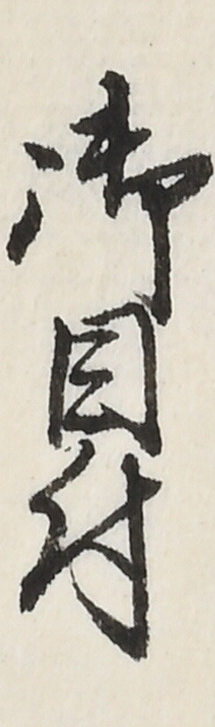御目付
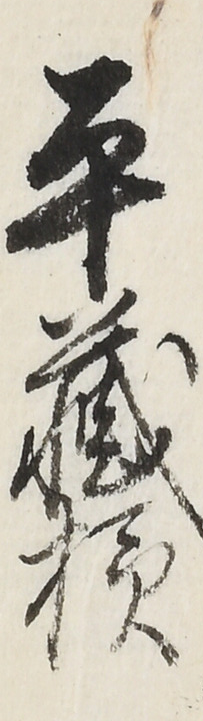平蔵様
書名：元治二乙丑年三月石切名前書上帳
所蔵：伊那市立高遠町図書館・合同会社AMANE
